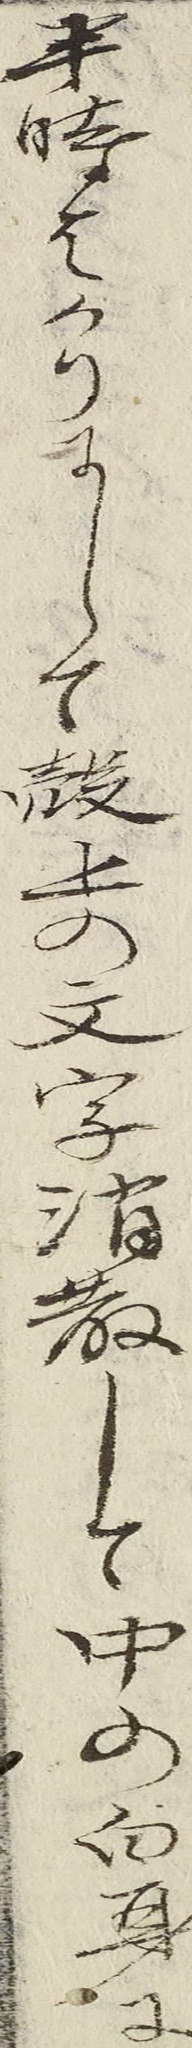判時はかりにして殻上の文字消散して中の白身に
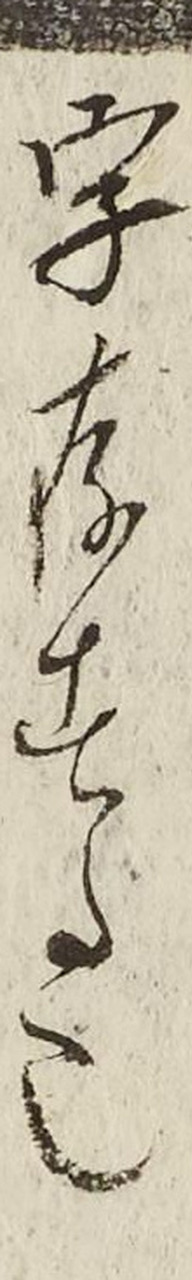字存する也
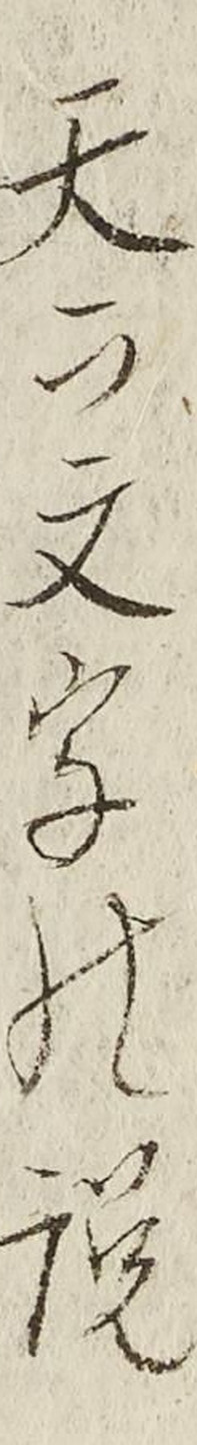天下文字の説
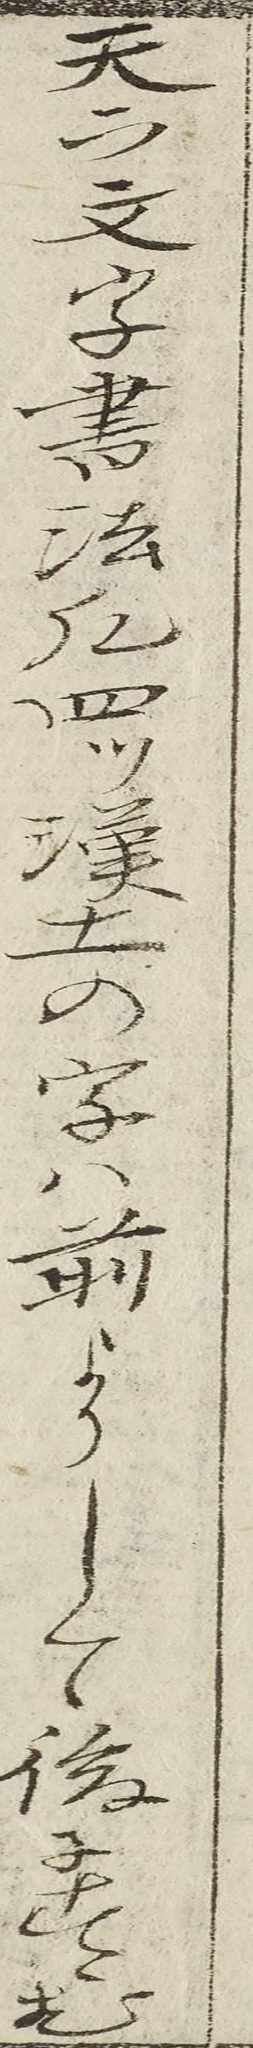天下文字書法凡四ッ漢土の字は前よりして後にすゝむ
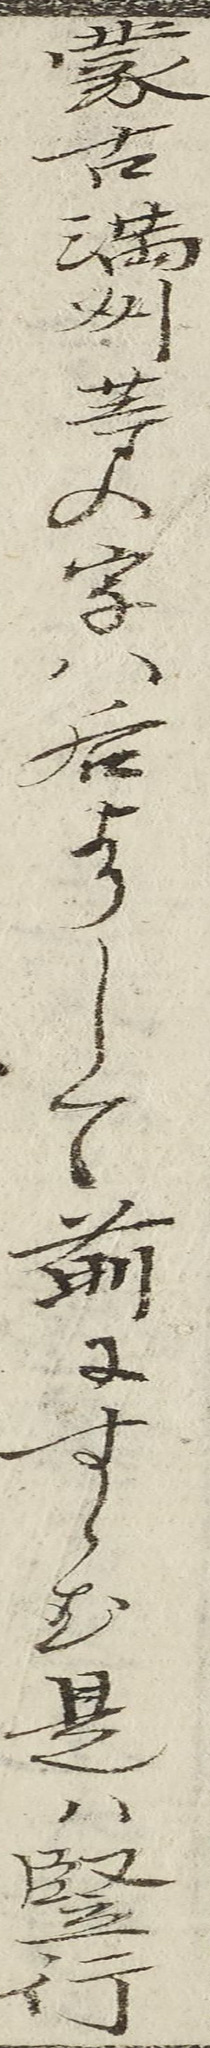蒙古満州等の字は后よりして前にすゝむ是ハ堅行
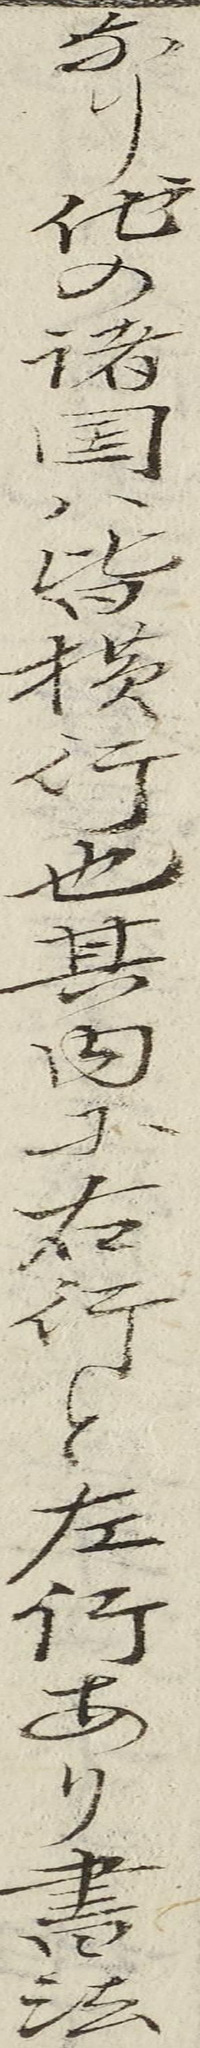なり他の諸国ハ皆横行也其内に右行と左行あり書法
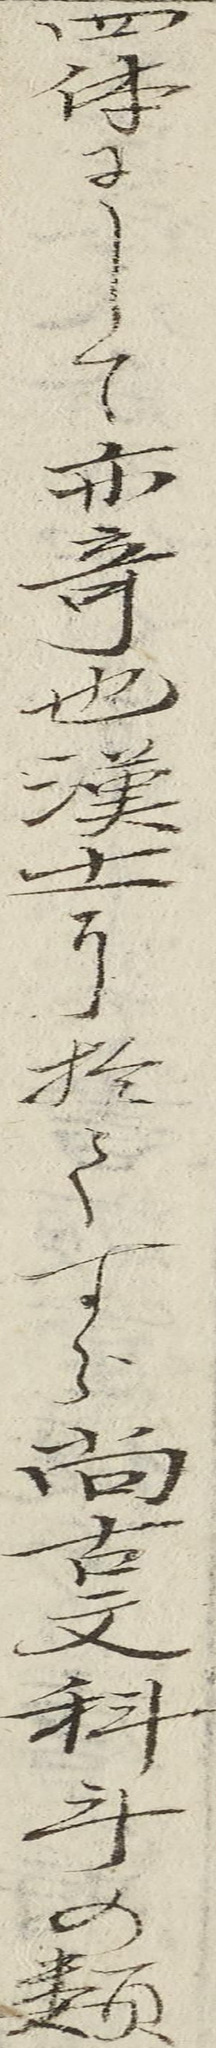四体にして亦奇也漢土に於てすら尚古文科斗の類
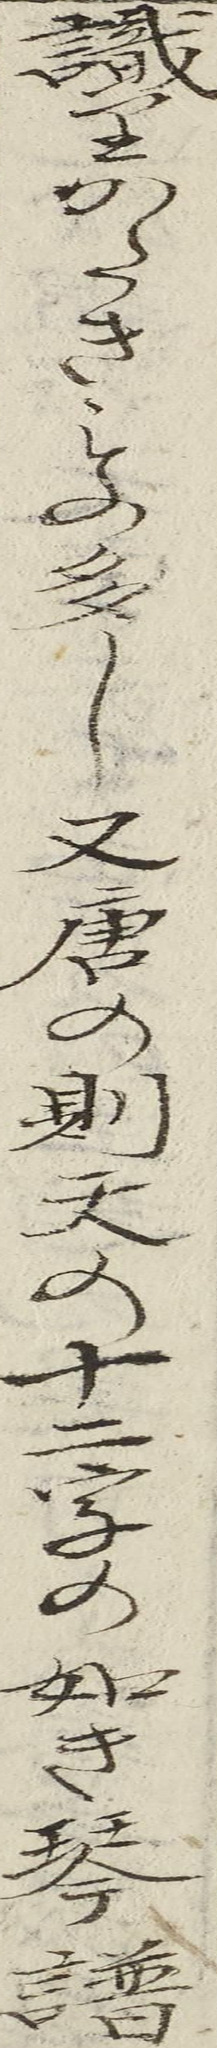識りかたきもの多し又唐の則天の十二字の如き琴譜
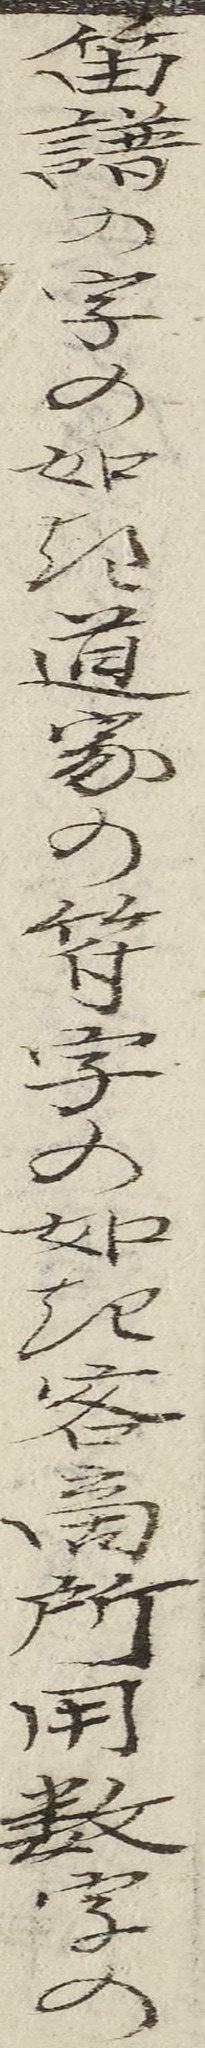笛譜の字の如き道家の符字の如き客商所数字の
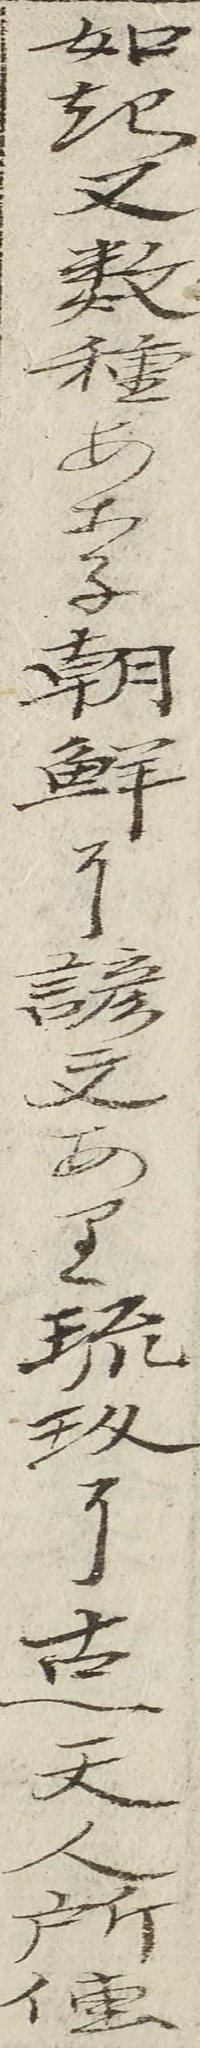如き又数種あり朝鮮に諺文り琉玖に古天人所伝

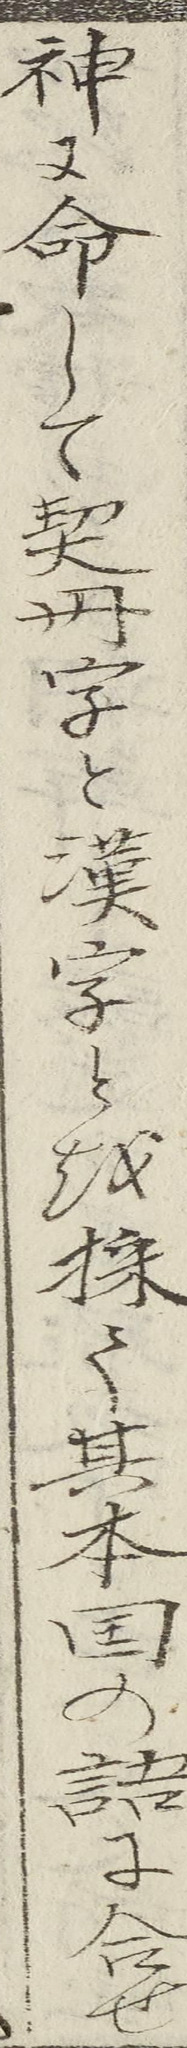神に命して契丹字と漢字とを採て其本国の語に合せ
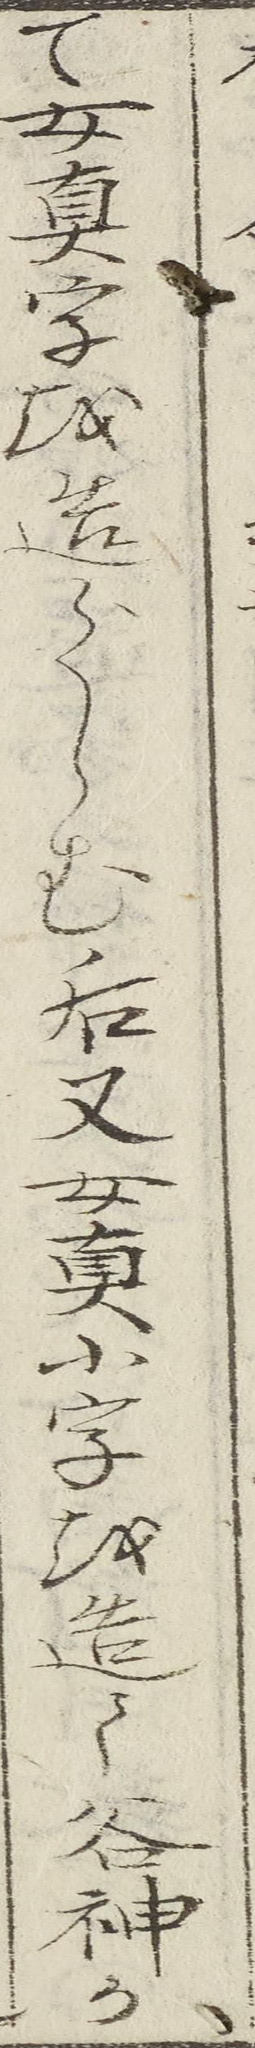て女真字を造らしむ后又女真小字を造て谷神か
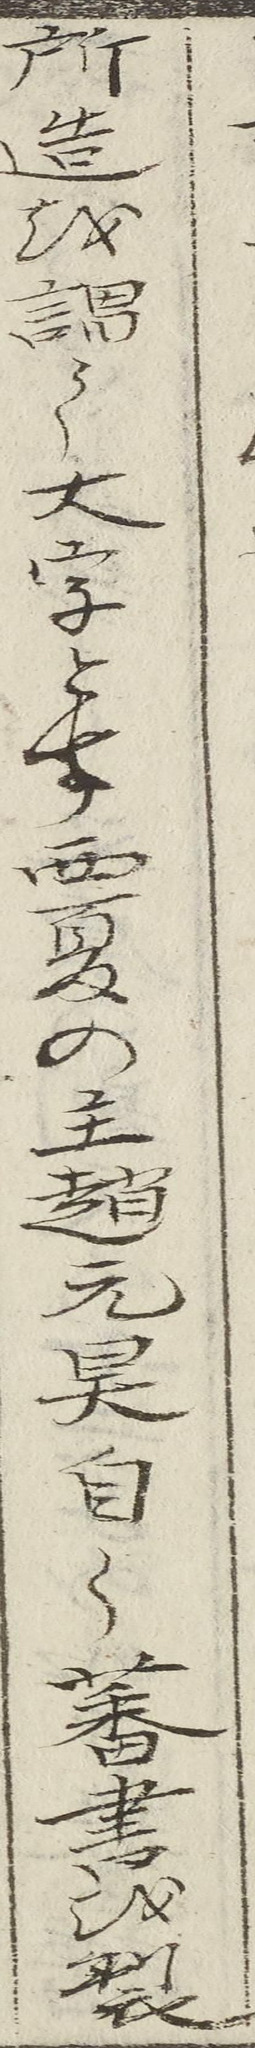所造を謂うて大字とす西夏の主趙元旲自ら蕃書を製
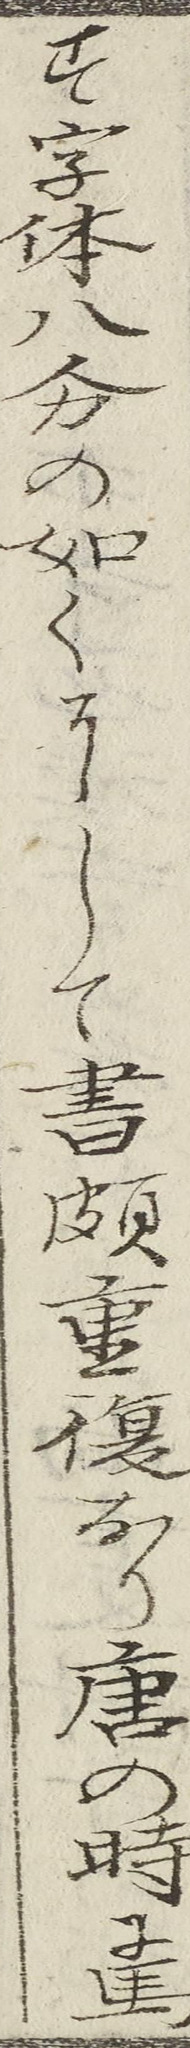す字体八分の如くにして書頗重複なり唐の時に馬
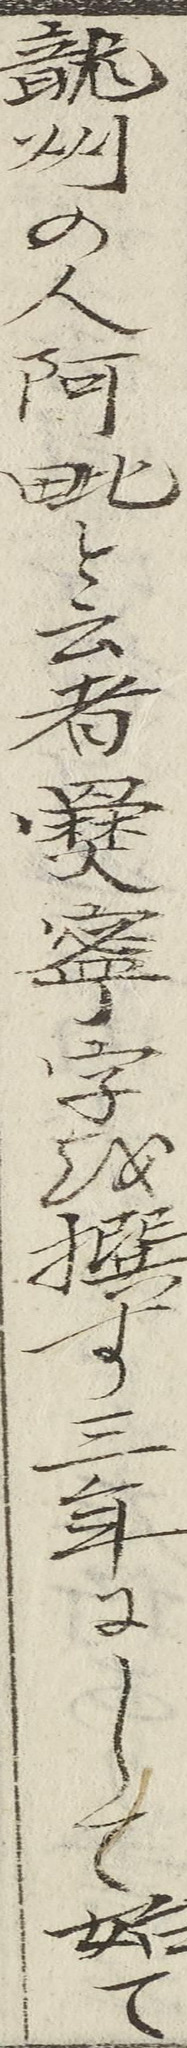戠州の人阿と云者爨寧字を撰す三年にして始て
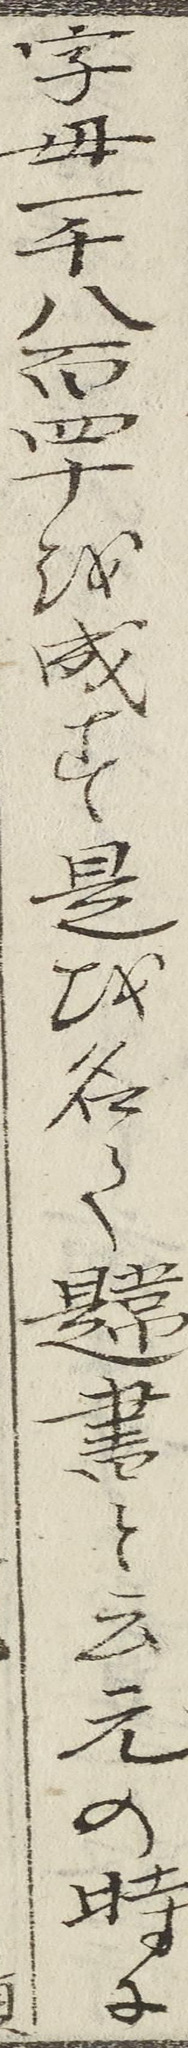字母一千八百四十を成す是を名て書と云元の時に
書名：西洋雜記　坤
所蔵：東京大学地震研究所図書室 Earthquake Research Institute Library, The University of Tokyo, JAPAN
